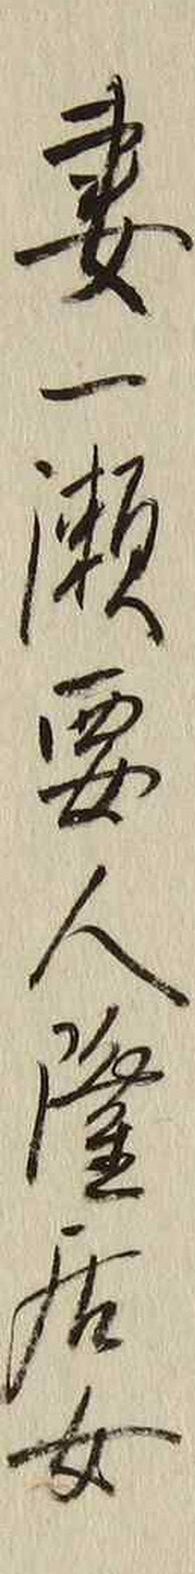妻一瀬要人隆居女
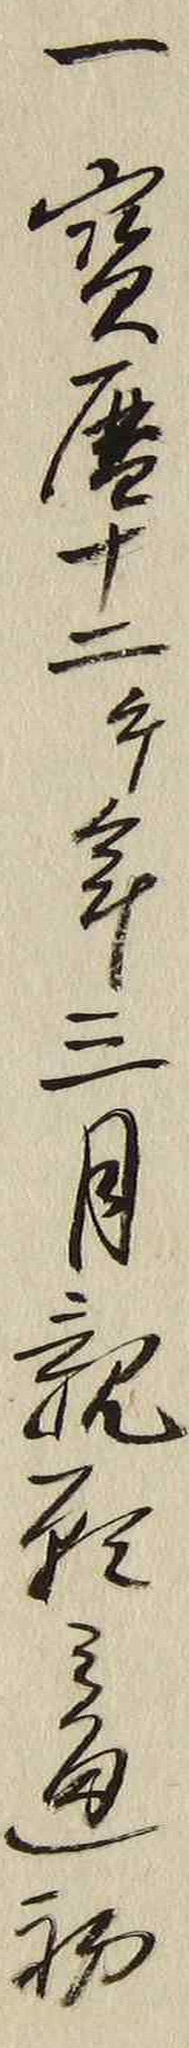一宝暦十二午年三月親願之通初
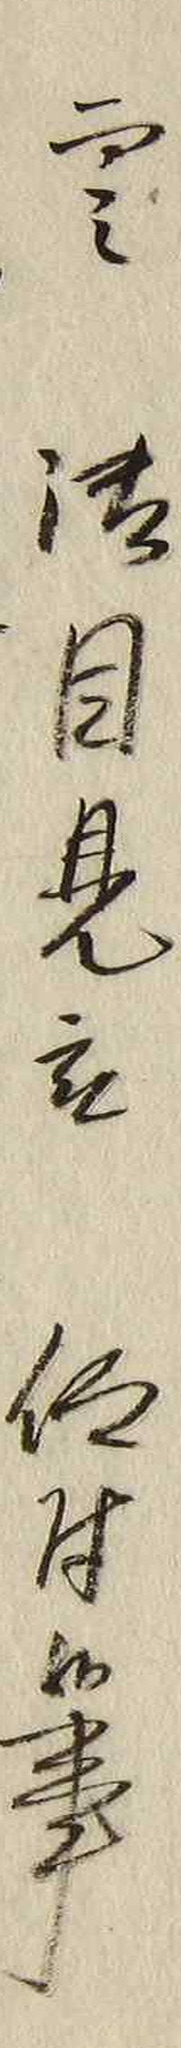而之御目見被仰付候事
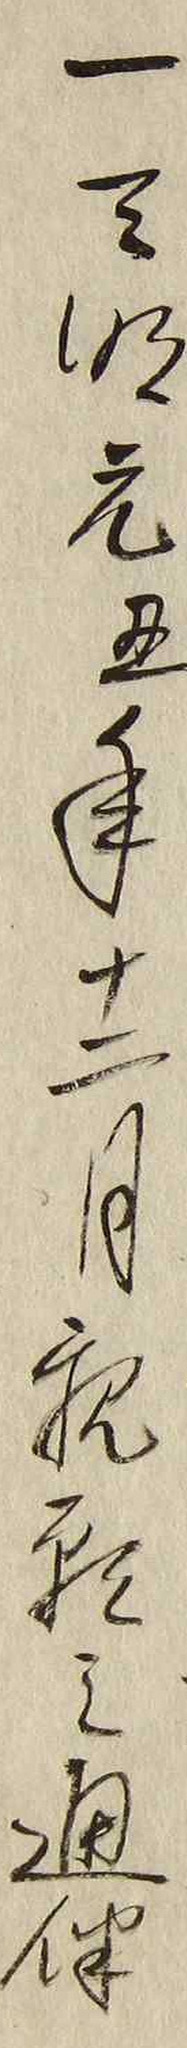一天明元丑年十二月親願之通伴

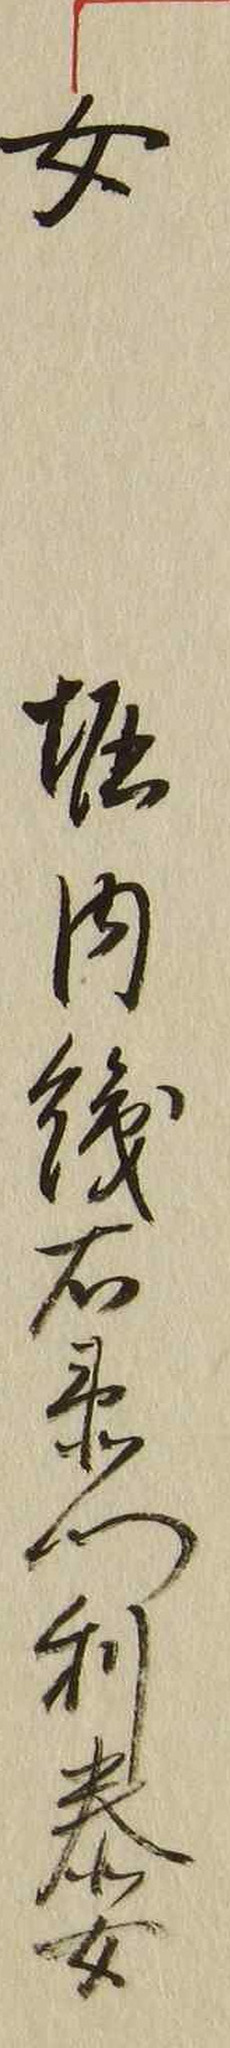女堀内銭右衛門利泰女
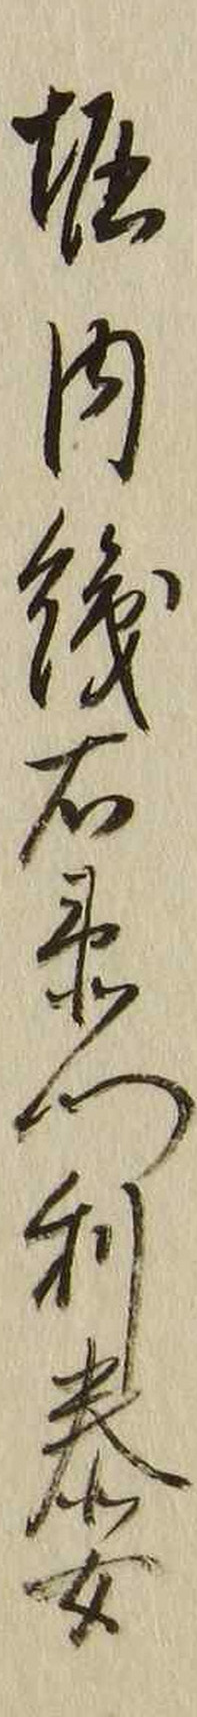女堀内銭右衛門利泰女
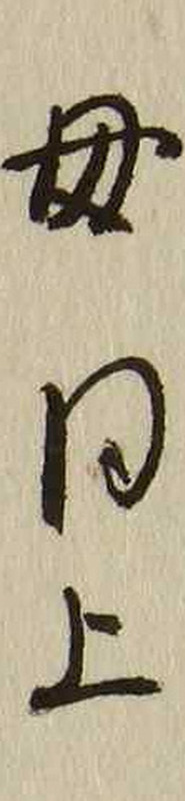母同上
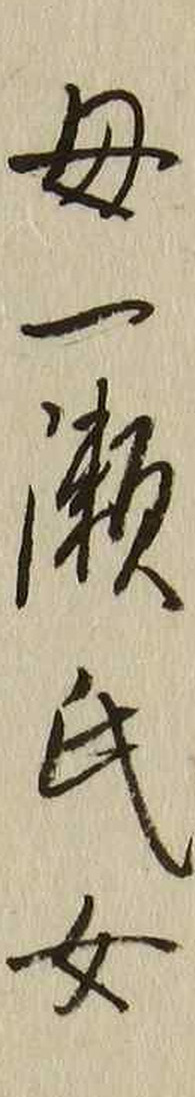母一瀬氏女
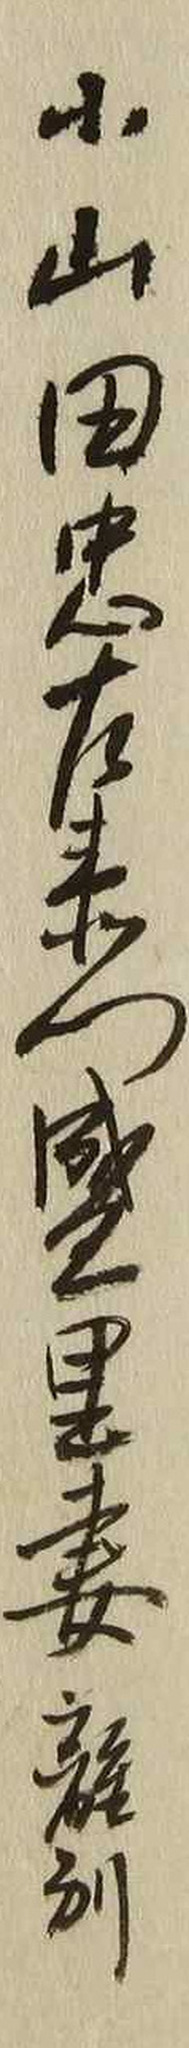小山田忠左衛門盛里妻離別
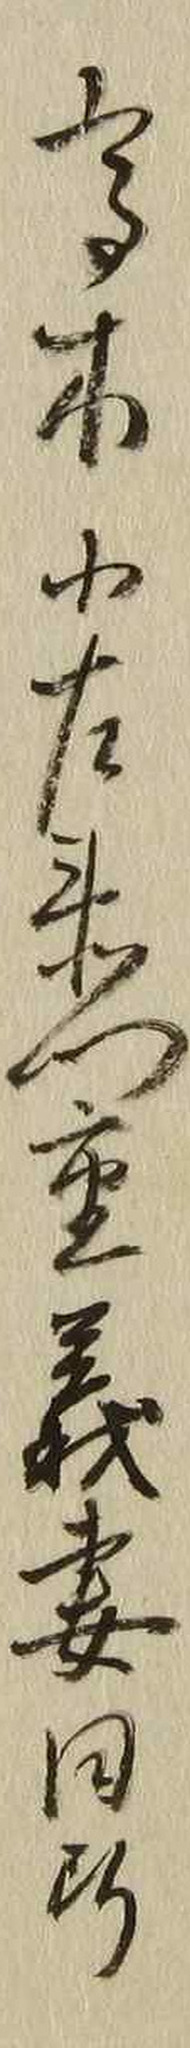高木小左衛門重義妻同断
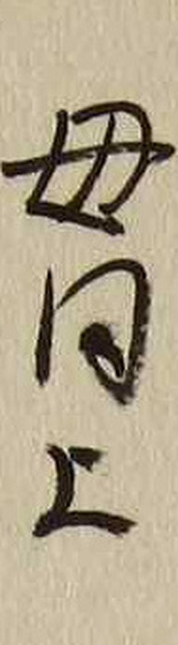母同上
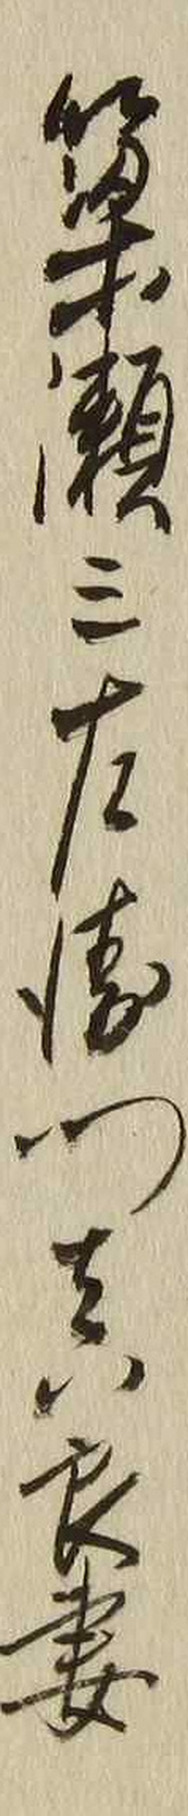梁瀬三左衛門真良妻
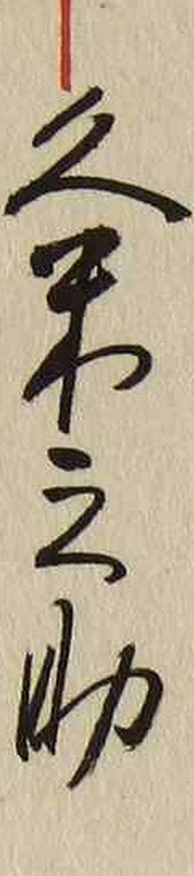久米之助
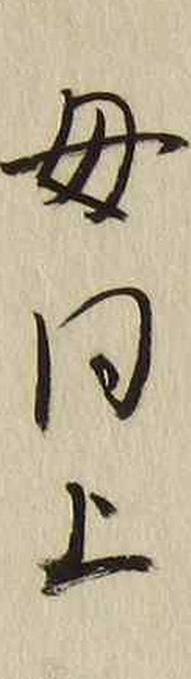母同上

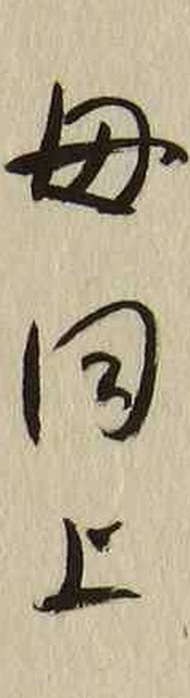母同上
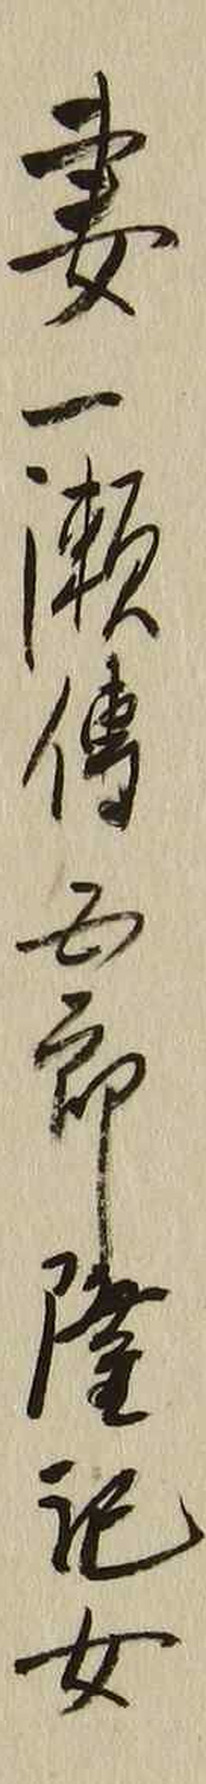妻一瀬伝五郎隆記女
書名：諸士系譜　巻之356　す之部6
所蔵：会津若松市立会津図書館
